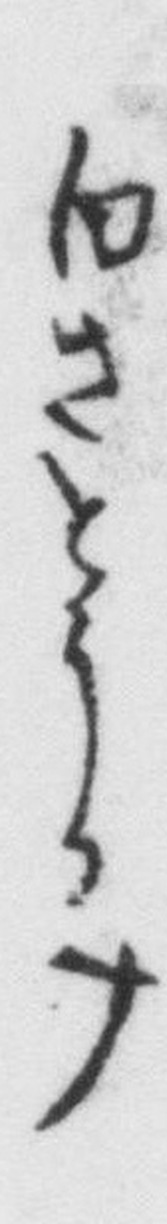白さとうかけ
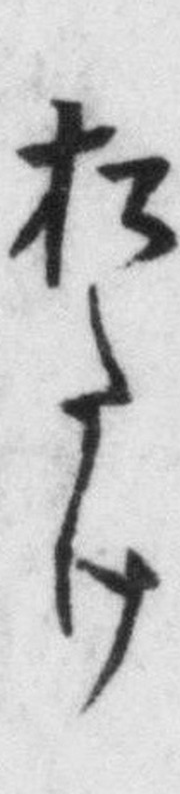松たけ
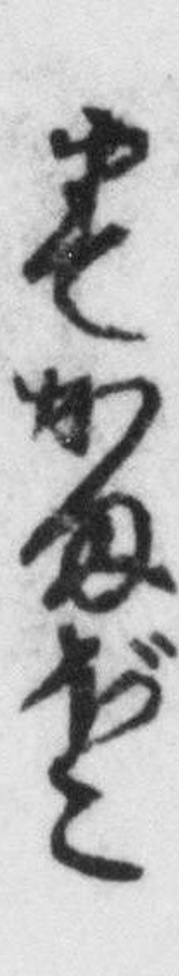巻かまぼこ
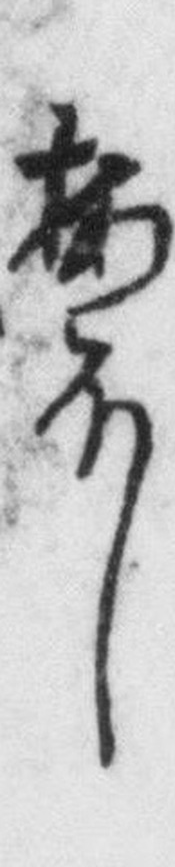梅ほし
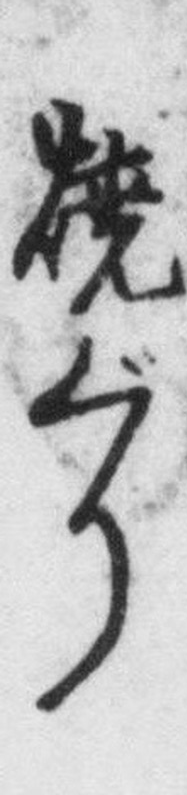焼ぐり
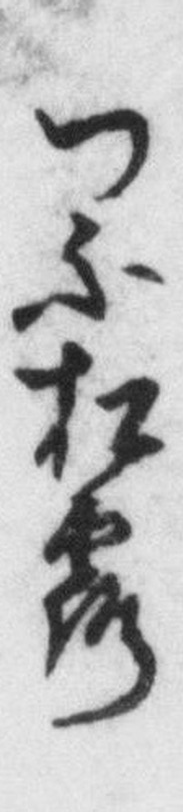つふ松露

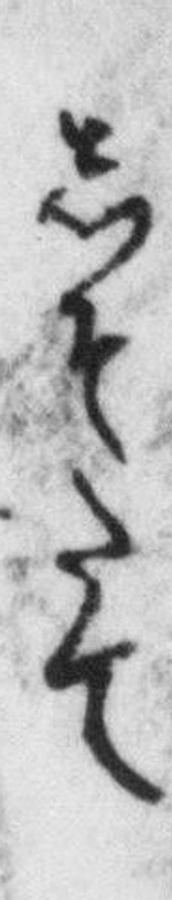しそたて
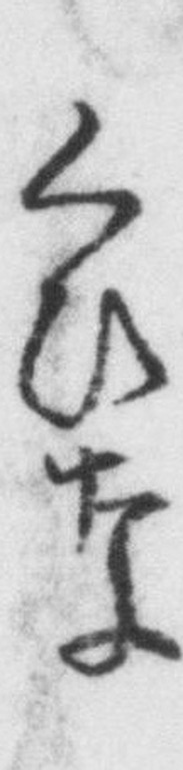くひな
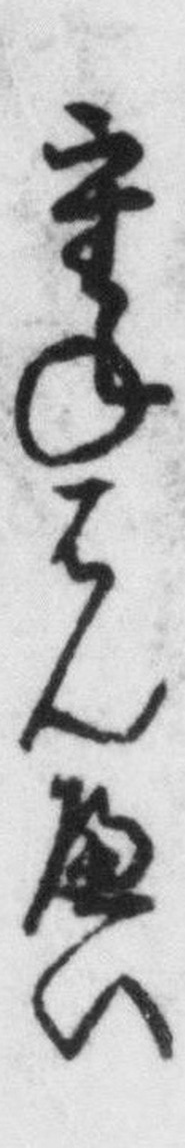大平はんへい
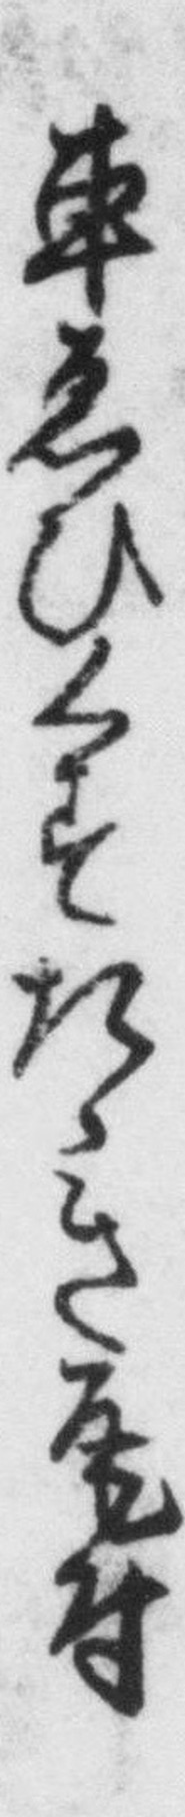車ゑひくすたゝき付
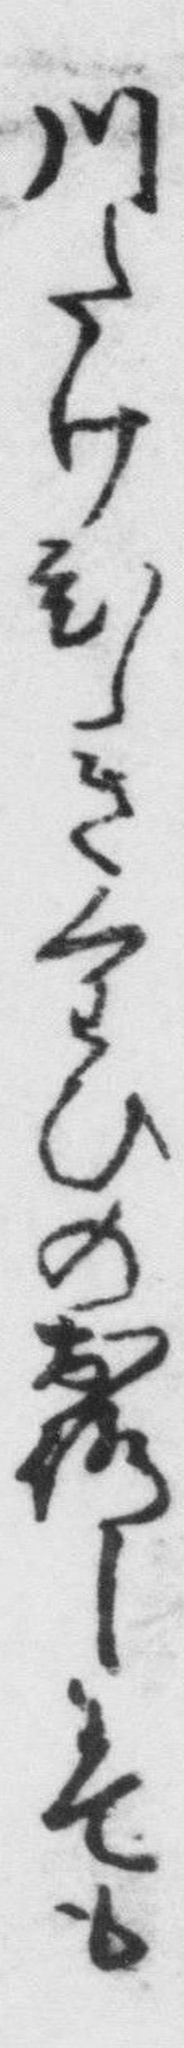川たかひらきくわひのお作りにても
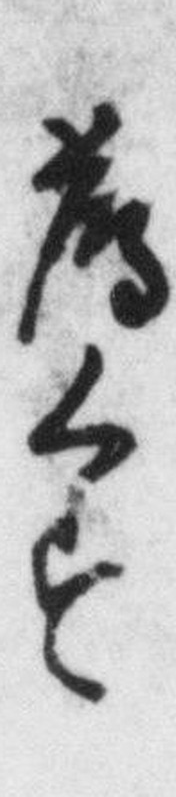薄くす

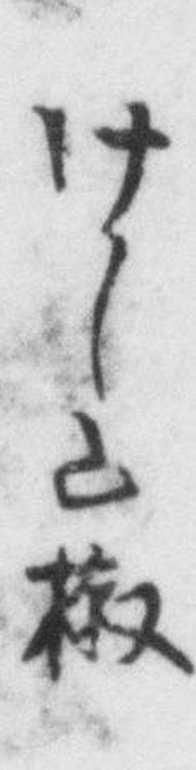けし山椒
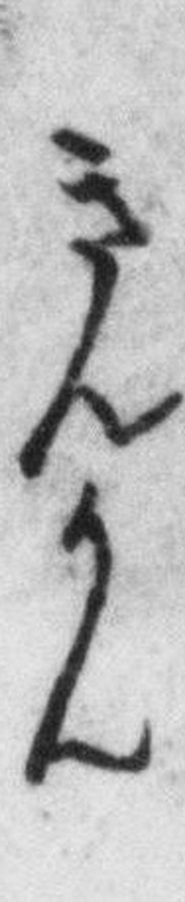きんかん
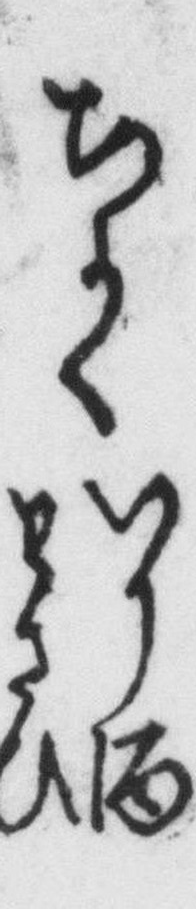ちよくいり酒飯
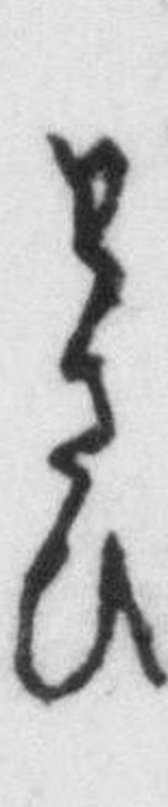わさひ
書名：卓子料理仕様
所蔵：大阪府立大学学術情報センター 国文学研究資料館
